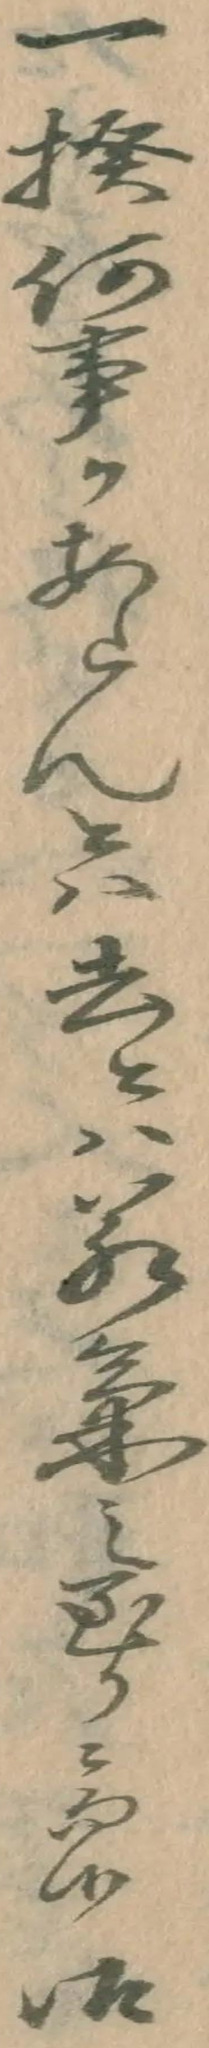一揆何事かあらんとは去とは若気之至りに而候御

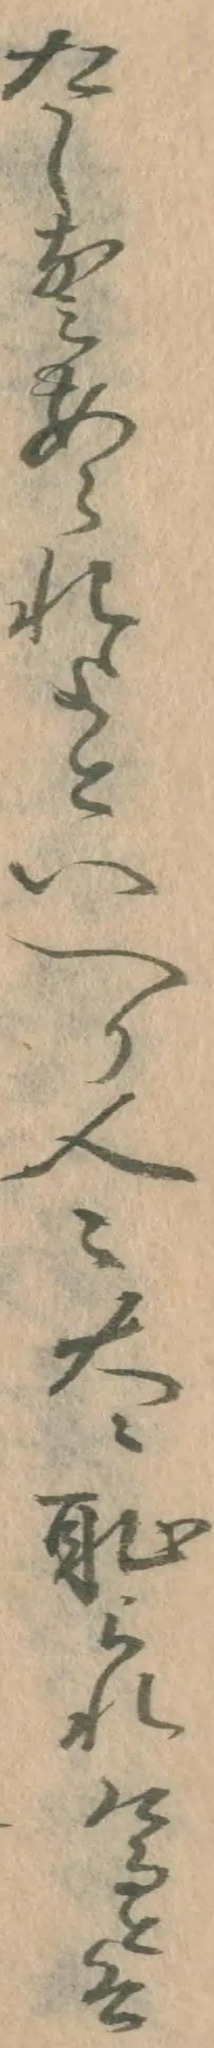たしならあられよといへり人々大に恥られけるとそ
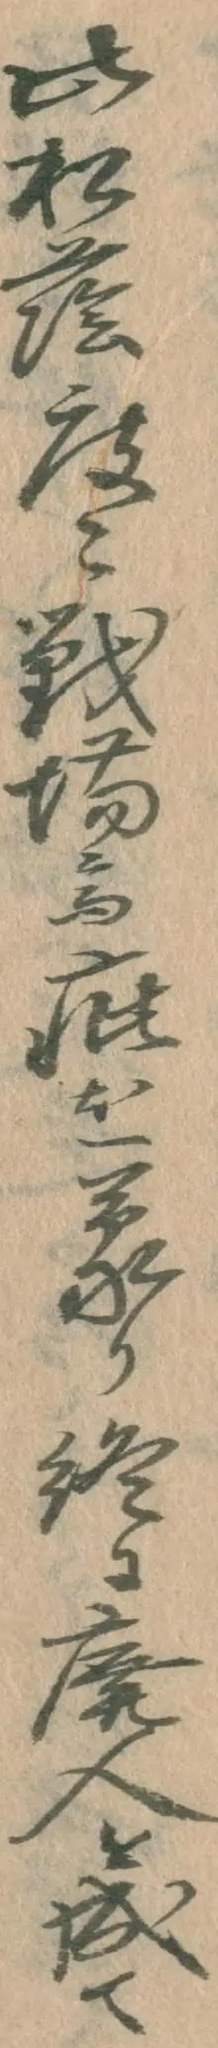此松蔭度々戦場に而疵を蒙り終る廃人と成て
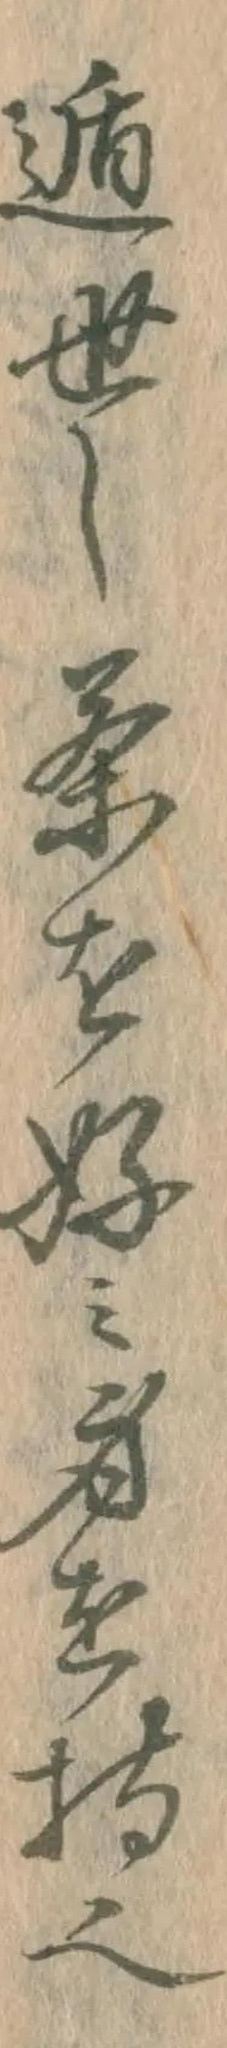遁世し茶を好み身を持也
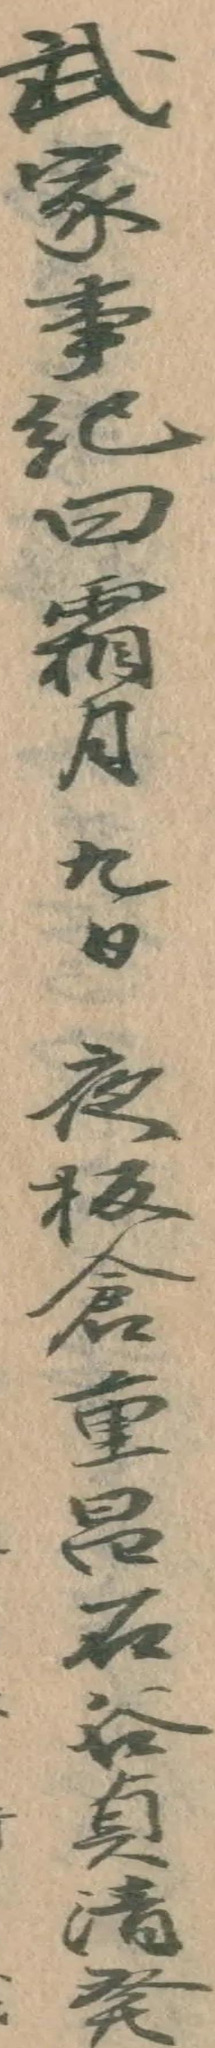武家事紀曰霜月九日夜板倉重昌石谷貞清発
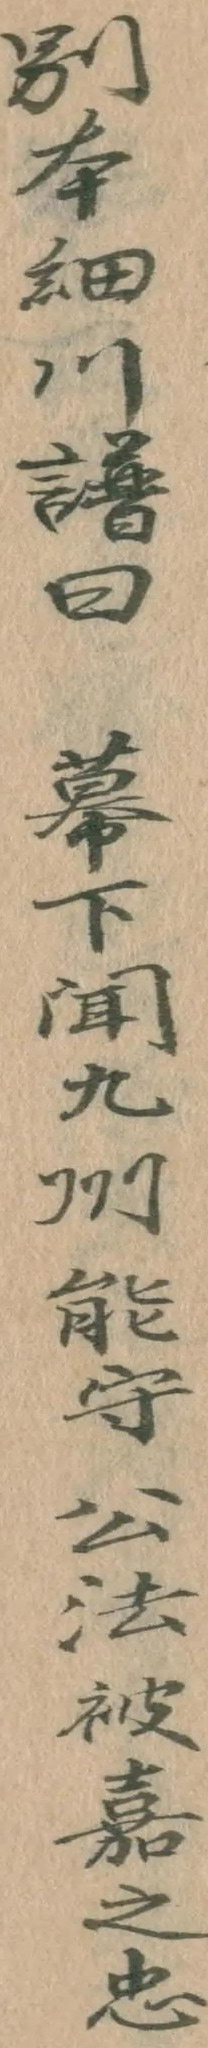別本細川譜曰幕下聞九州能守公法被嘉之忠
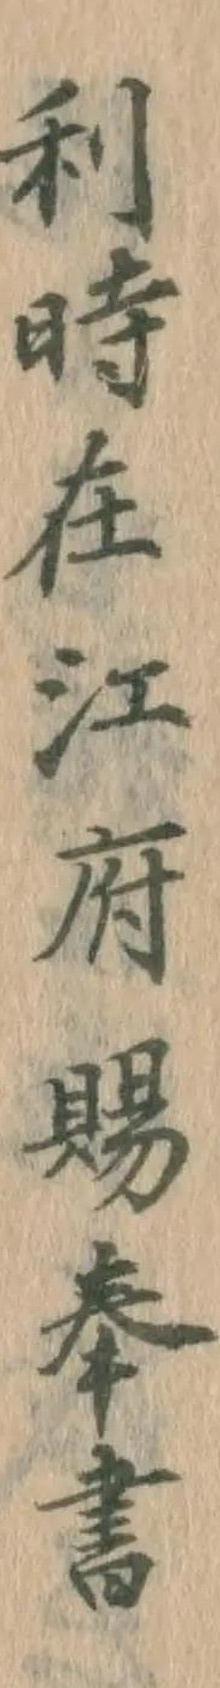利時在江府賜奉書
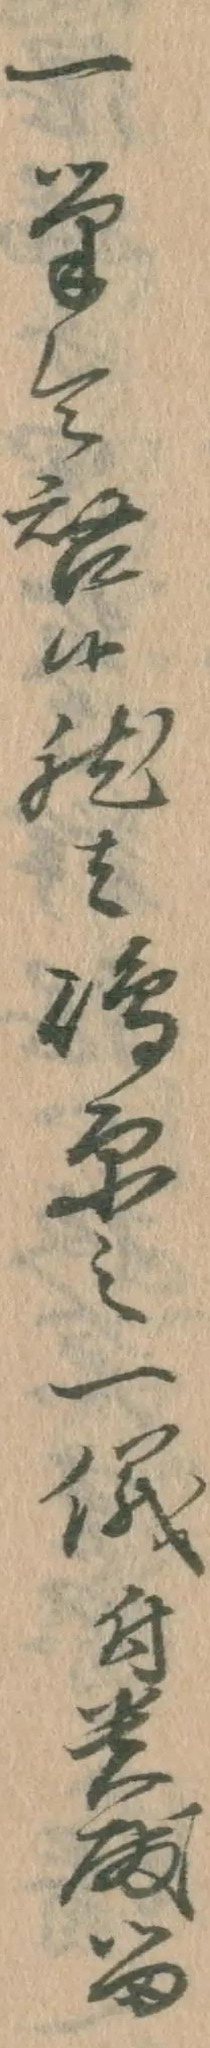一筆令啓候然者島原之一儀付貴殿留
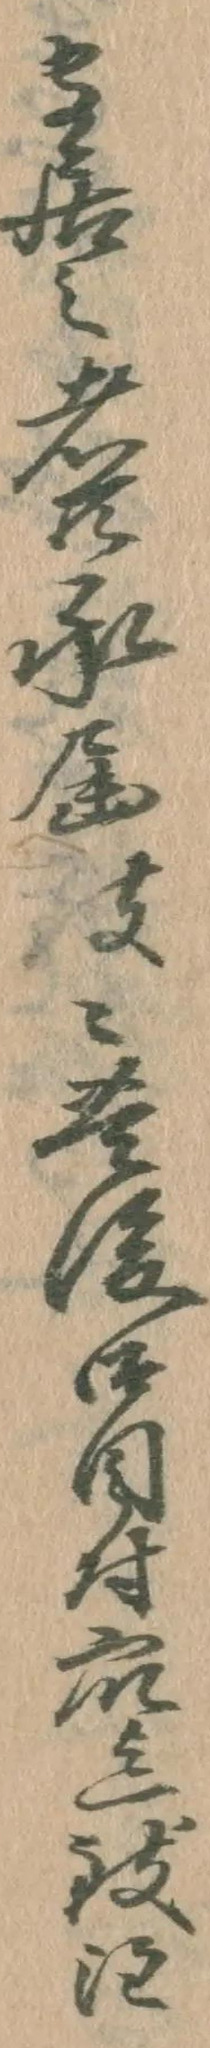守居之者共承届致に豊後御目付衆迄致注
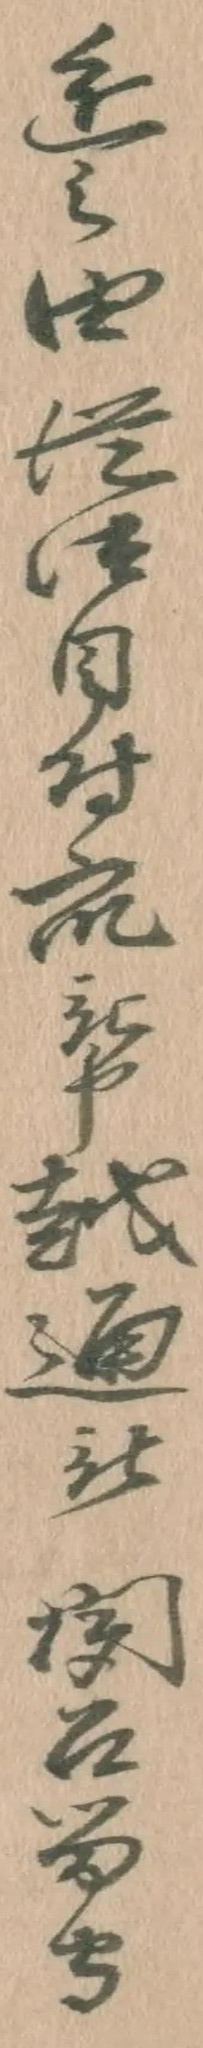進之由従御目付衆被申越通被聞召留守
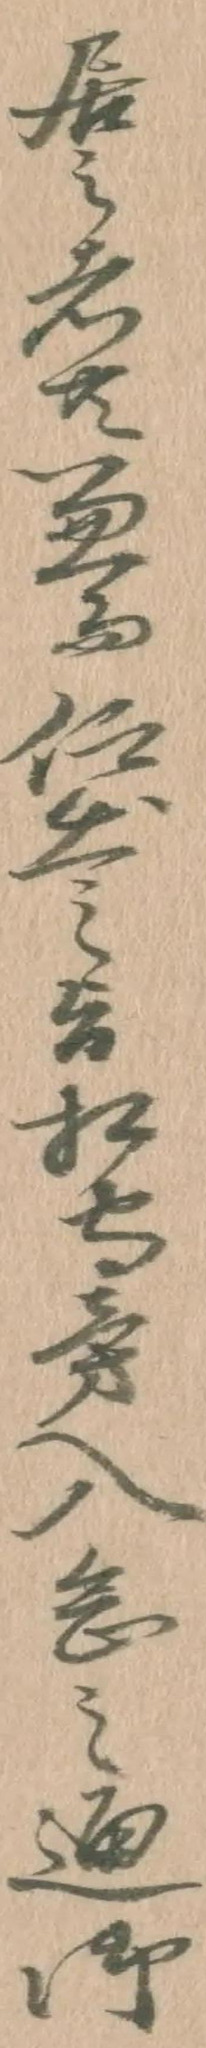居之者共兼而仰出之旨相守旁入念之通御
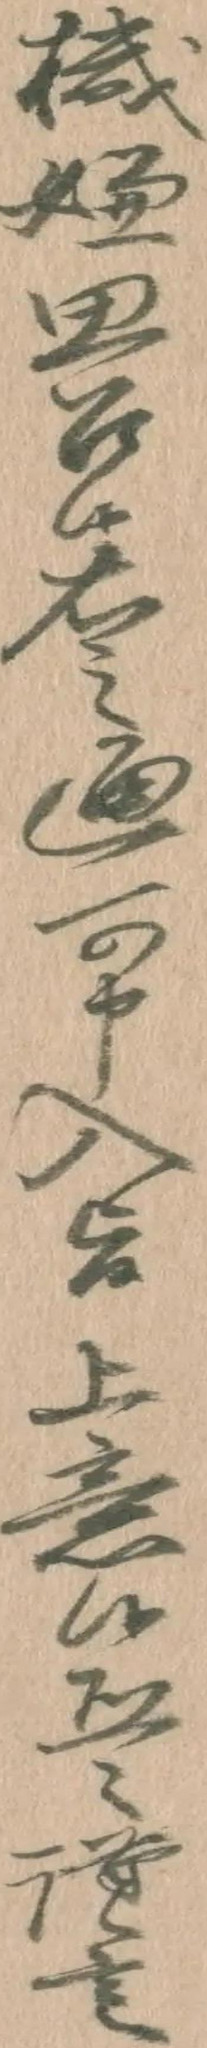機嫌思召候右之通可申入旨上意候恐々謹言
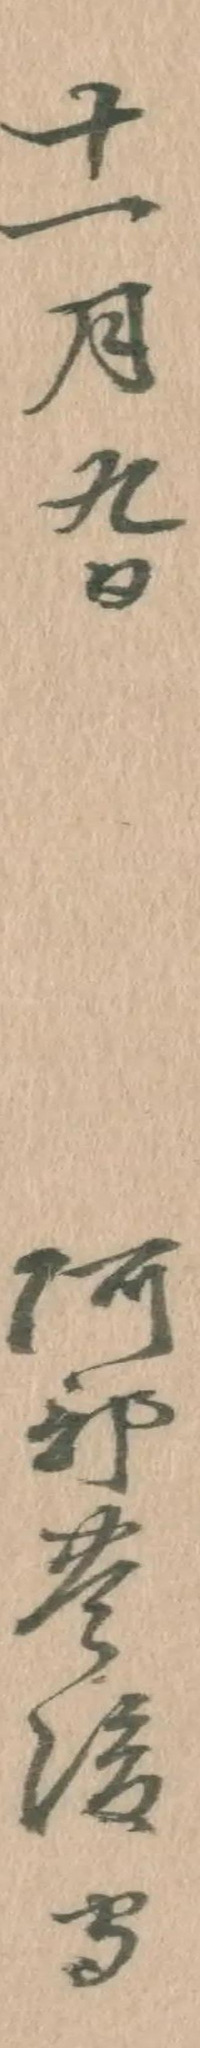十一月九日阿部豊後守
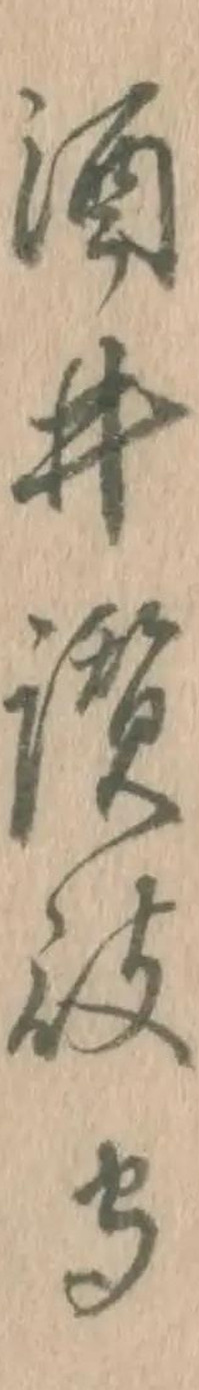酒井讃岐守
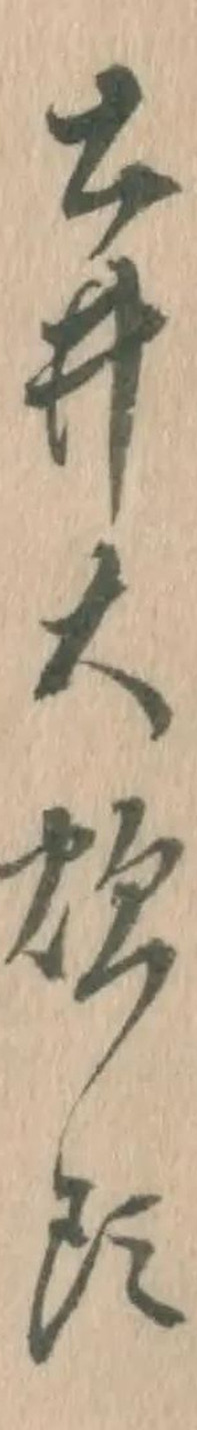土井大炊頭
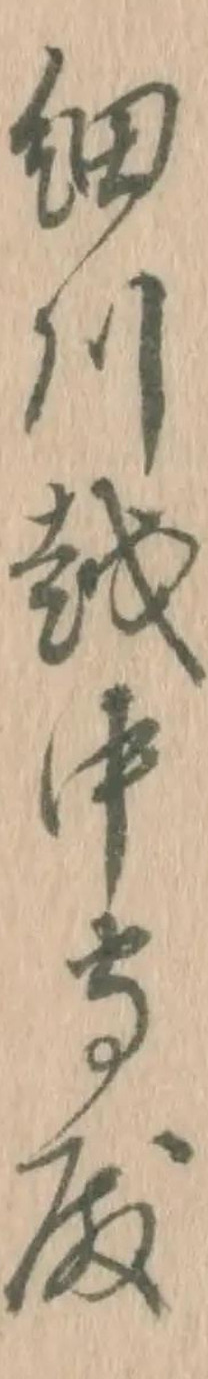細川越中守殿
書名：切支丹御退治記 49巻. [2]
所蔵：国立国会図書館 National Diet Library, JAPAN
